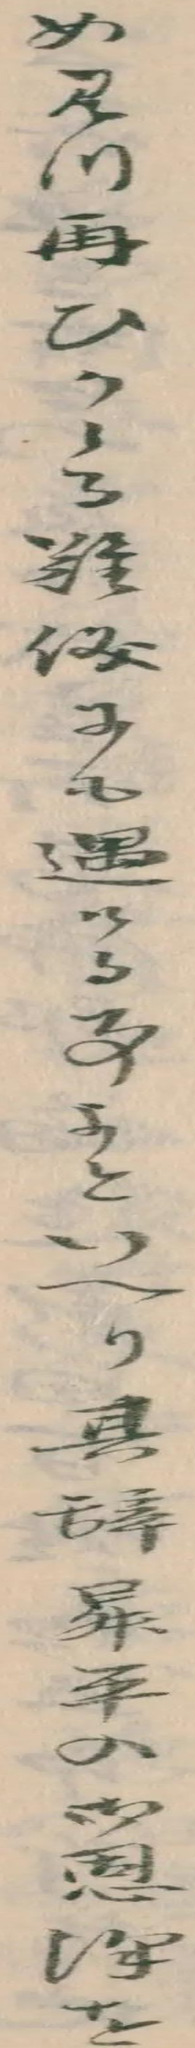め見つ再ひかゝる難儀にも遇ける事よといへり其辞昇平の御恩沢を
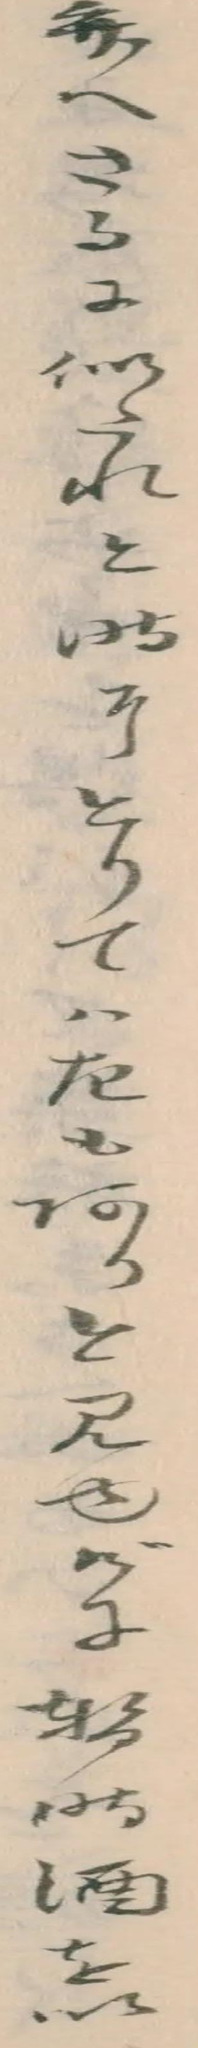弁へさるに似たれと時にとりては左もありと見ゆげに暫時酒を以
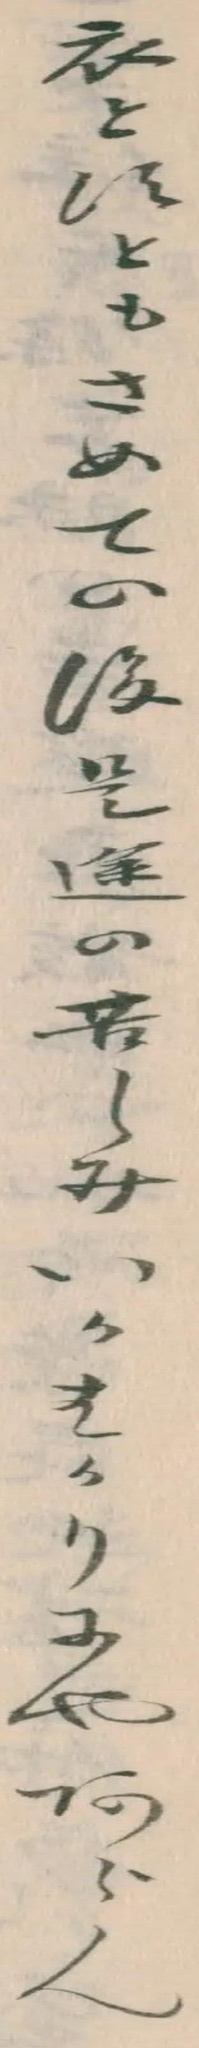衣とすともさめての後是途の苦しみいかはかりにやあらん
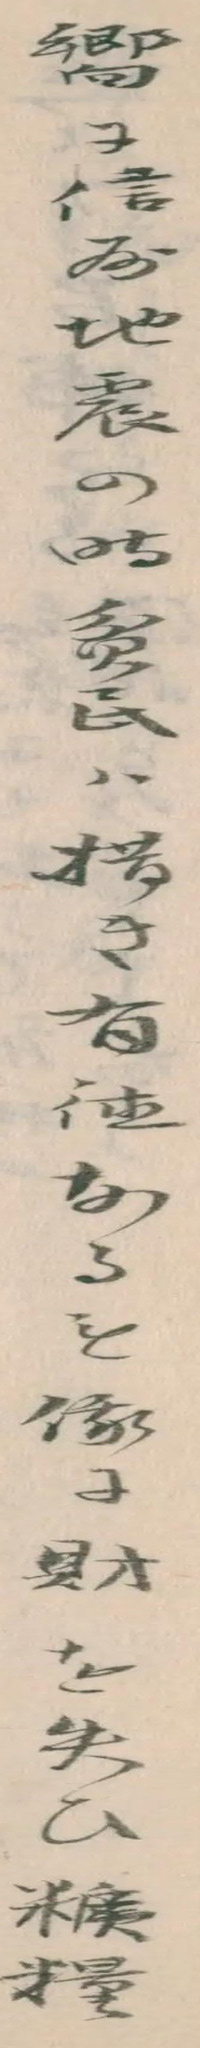嚮に信州地震の時貧民は措き有徝なるも俄に在を失ひ糠糧
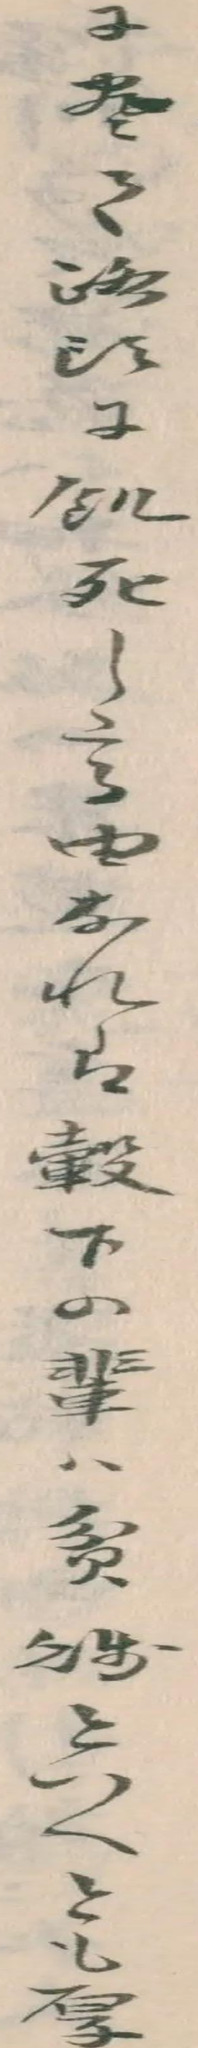に尽て路頭に飢死したる由なれは轂下の輩は貧賎といへとも厚
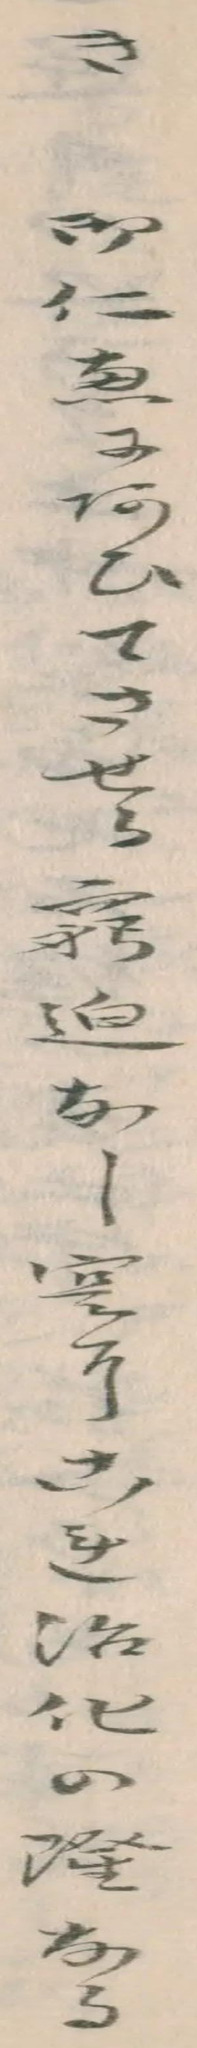き御仁恵にあひてさせる窮迫なし寔にこれ治化の隆なる
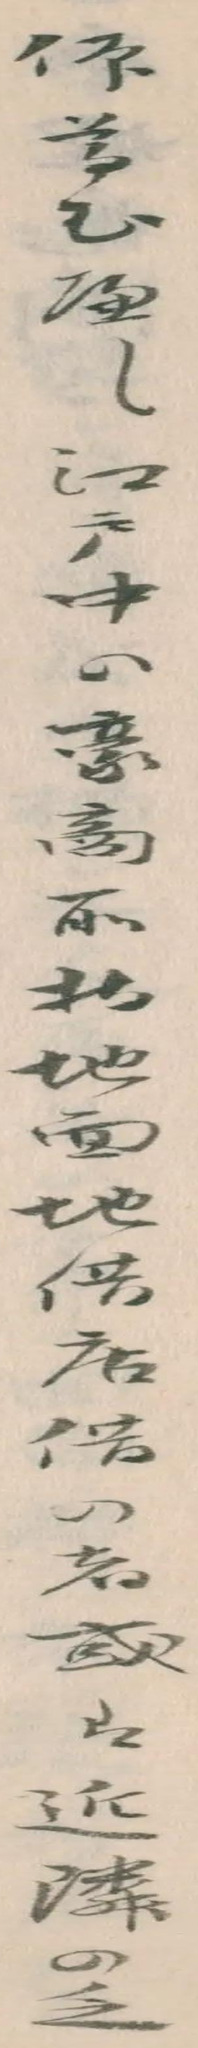仰尊むへし江戸中の豪商所持地面地借店借の者或は近隣の乏
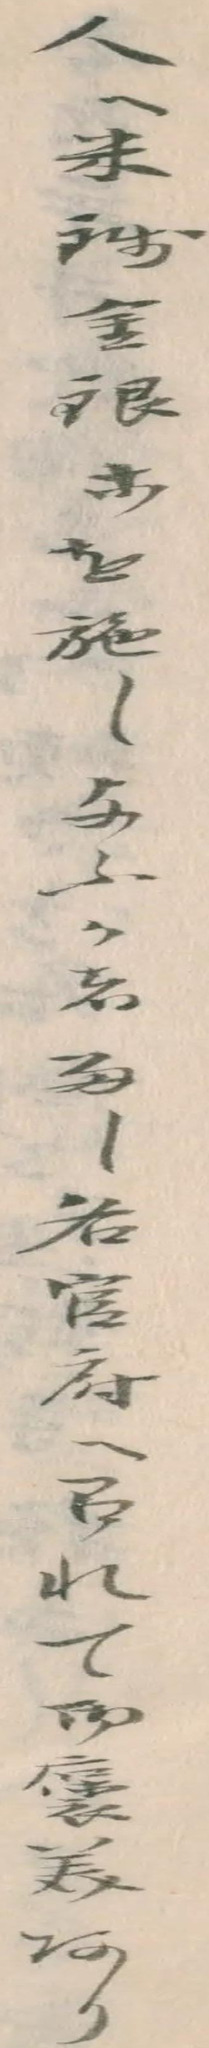人へ米銭金銀等を施し与ふか者多し各官府へ召れて御褒美あり
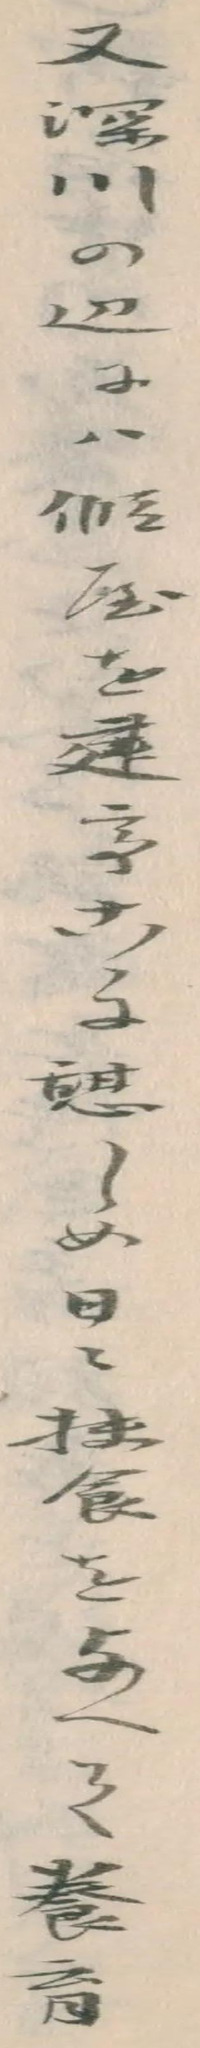又深川の辺には仮屋を建てこゝに憩しめ日々扶食を与へて養育
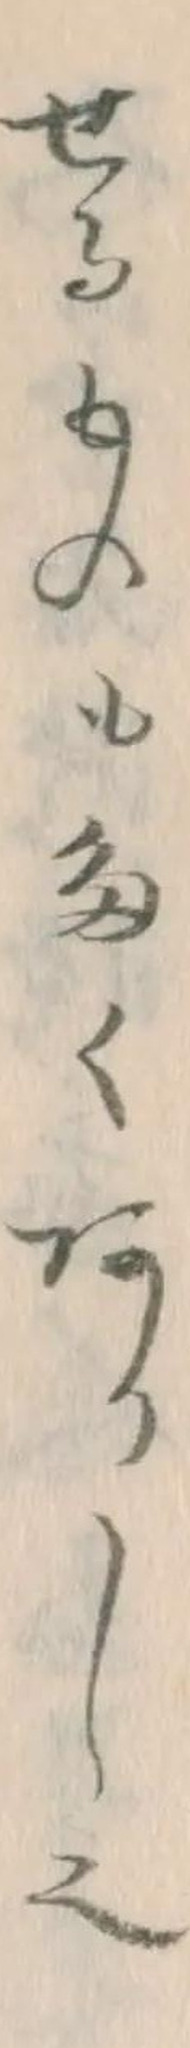せるものも多くありし也
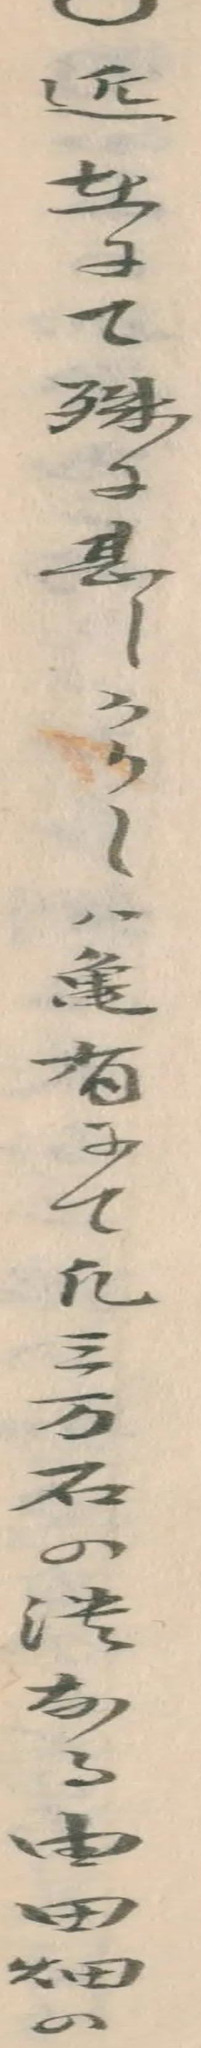〇近在にて殊に甚しかりしは亀有にて凡三万石の潰なる由田畑の

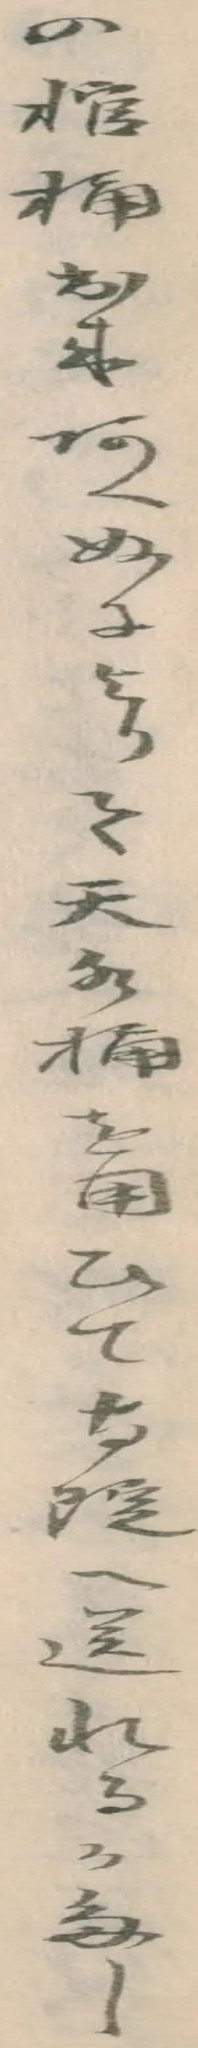の棺桶出来あへぬによりて天水桶を用ひて寺院へ送れるか多し
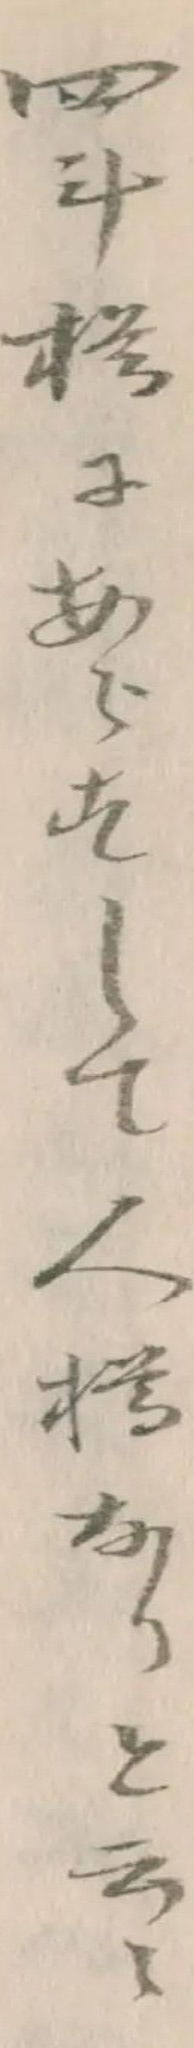四斗樽にあらすして人樽なりと云々
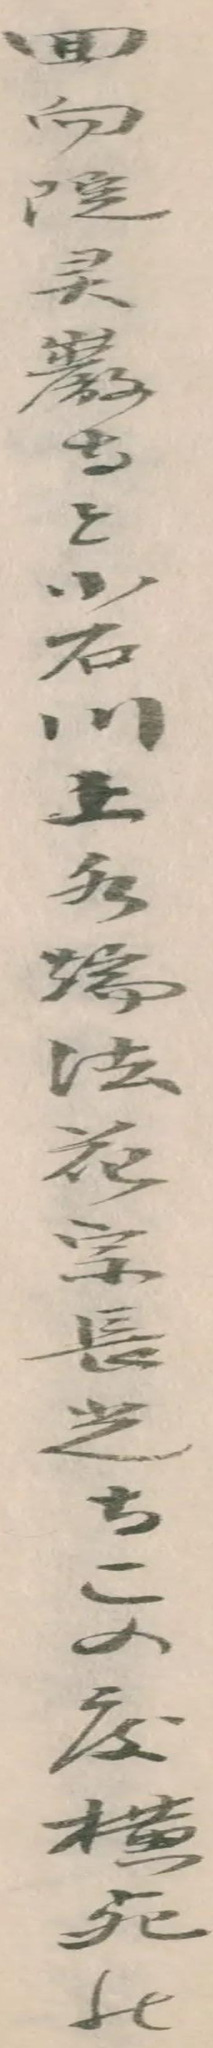回向院霊巖寺と小石川上水端法花宗長光寺この度横死の
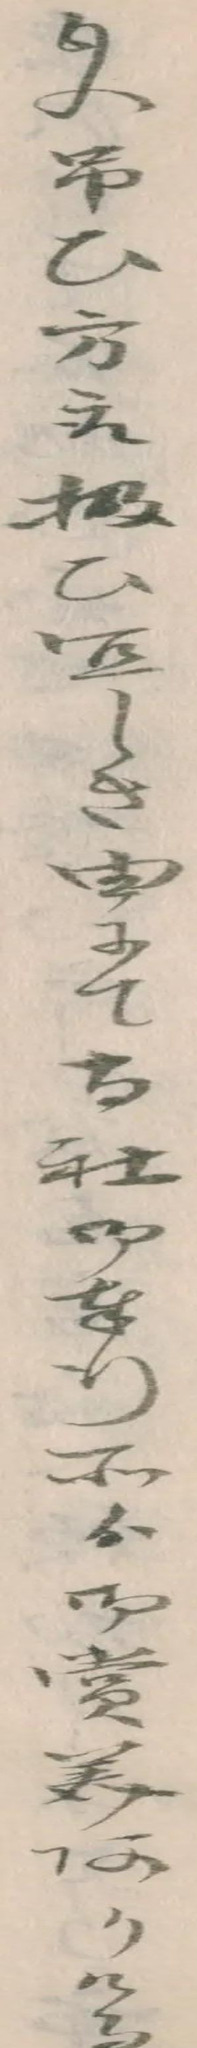もの弔ひ方取扱ひ宜しき由にて寺社御奉行所ゟ御賞美ありける
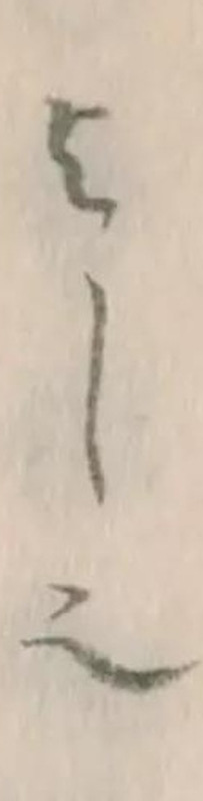よし也
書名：地災撮要. 巻7-9(地震之部)
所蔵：国立国会図書館 National Diet Library, JAPAN
